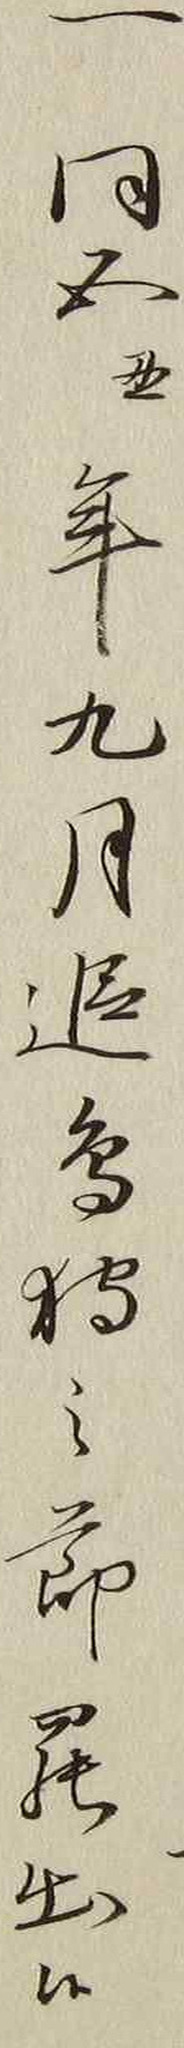一同五丑年九月追鳥狩之節罷出候
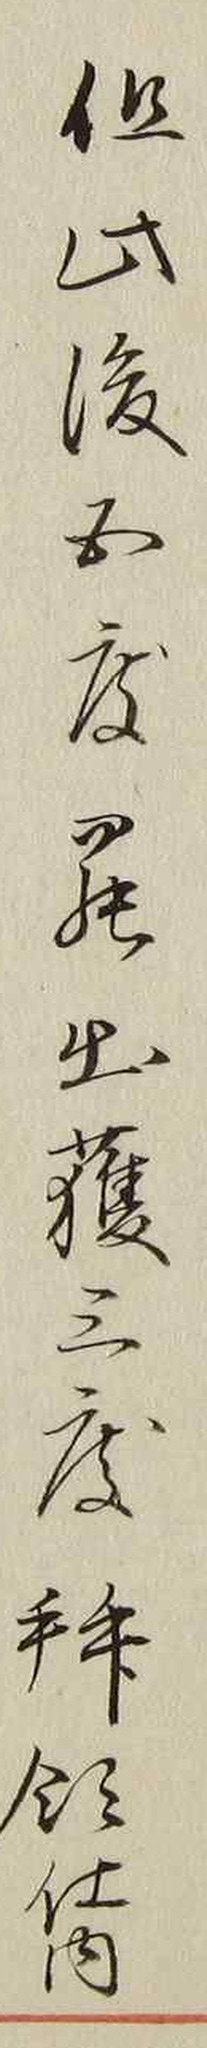但此後五度罷出獲三度拝領仕内
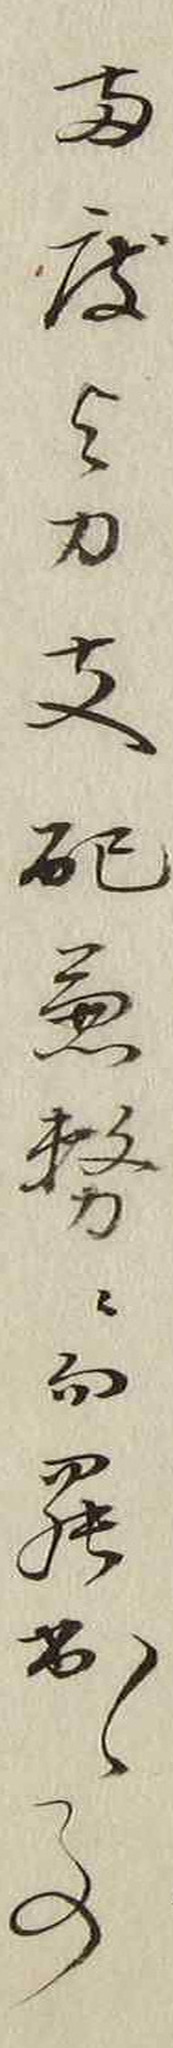両度与力支配兼務ニ而罷出候事
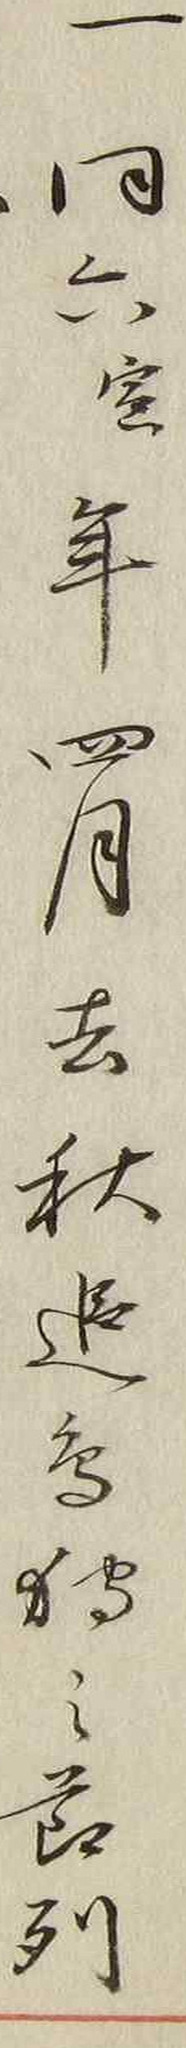一同六寅年四月去秋追鳥狩之節列
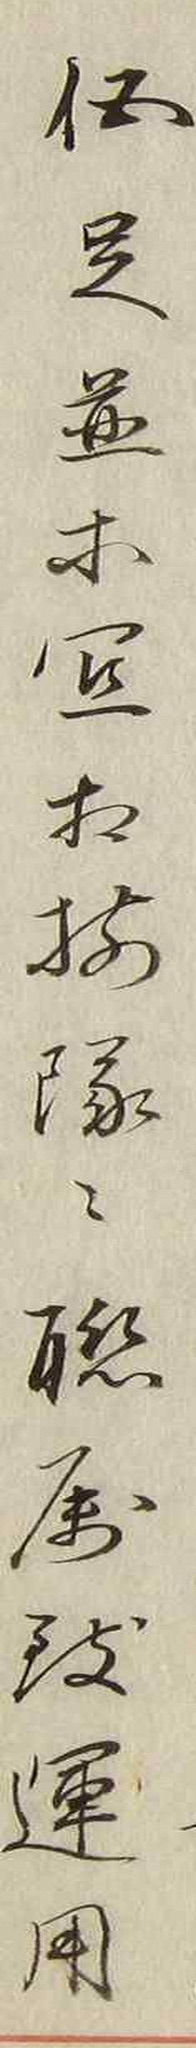伍足並等宜相揃隊々聯属致運用
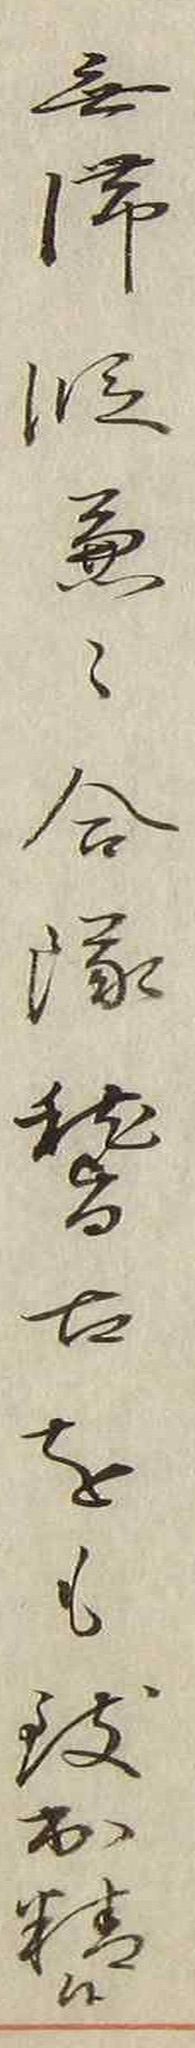無滞段兼々合隊稽古をも致出精候

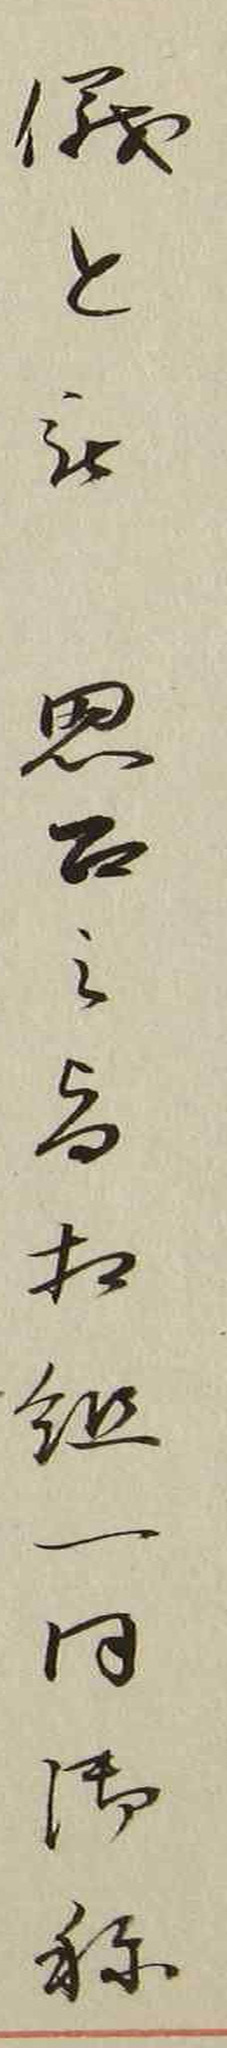儀と被思召之旨相組一同御称
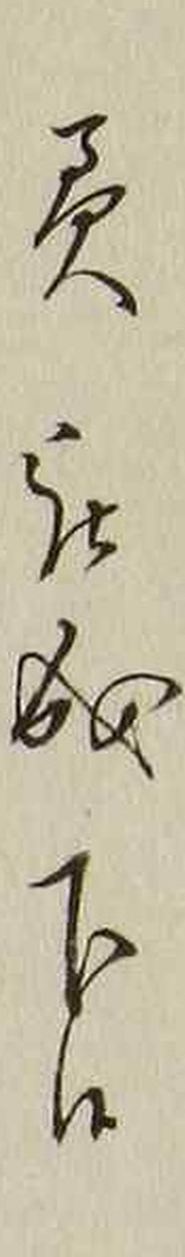美被成下候
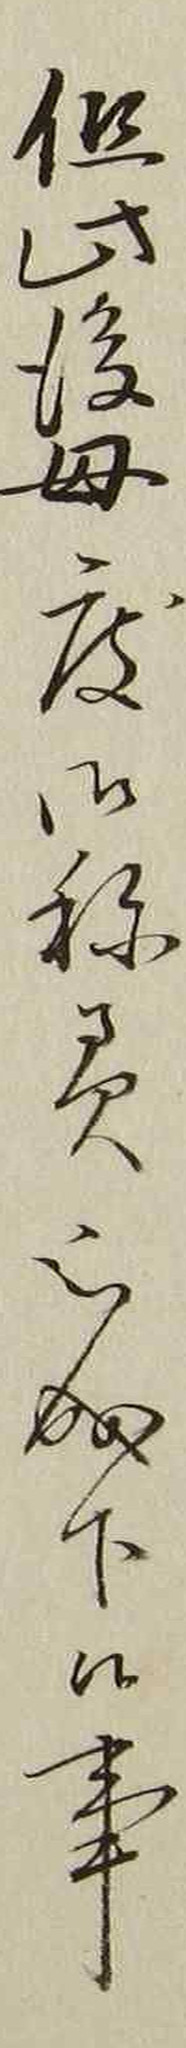但此後母度御称美被成下候事
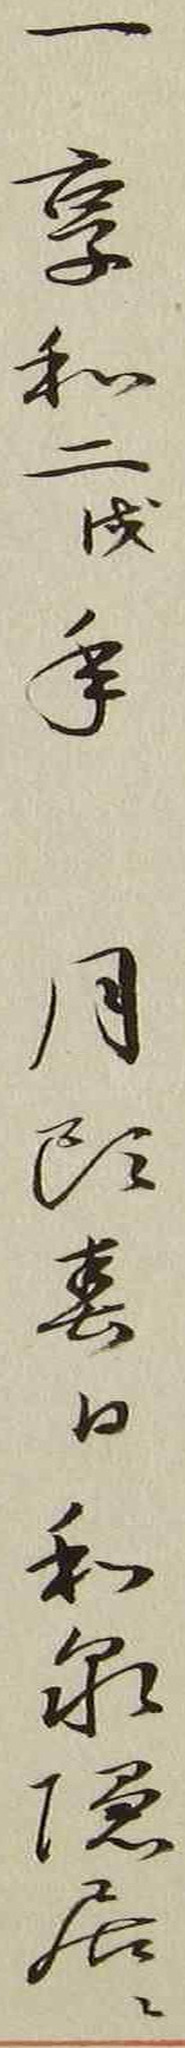一享和二戌年月頭春日和泉隠居ニ
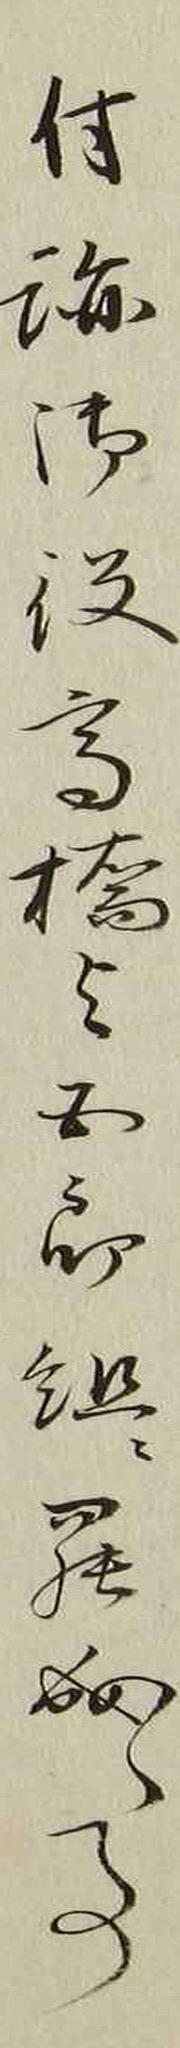付跡御役高橋与五郎組ニ罷成候事
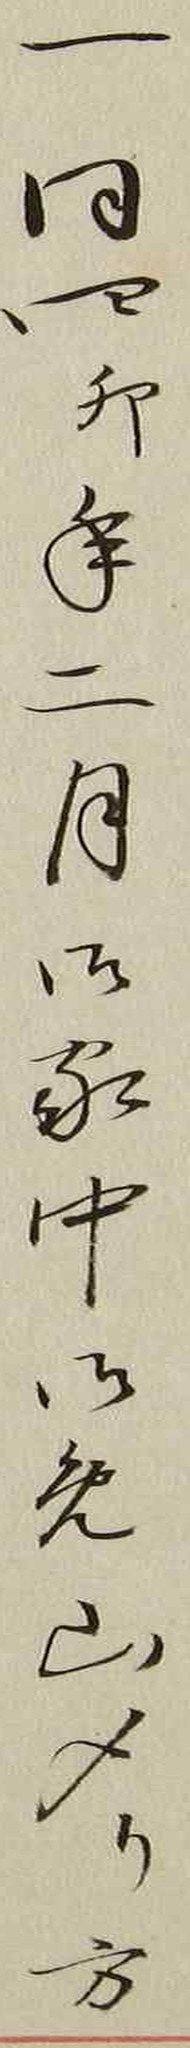一同四卯年二月御家中御免山〆り方
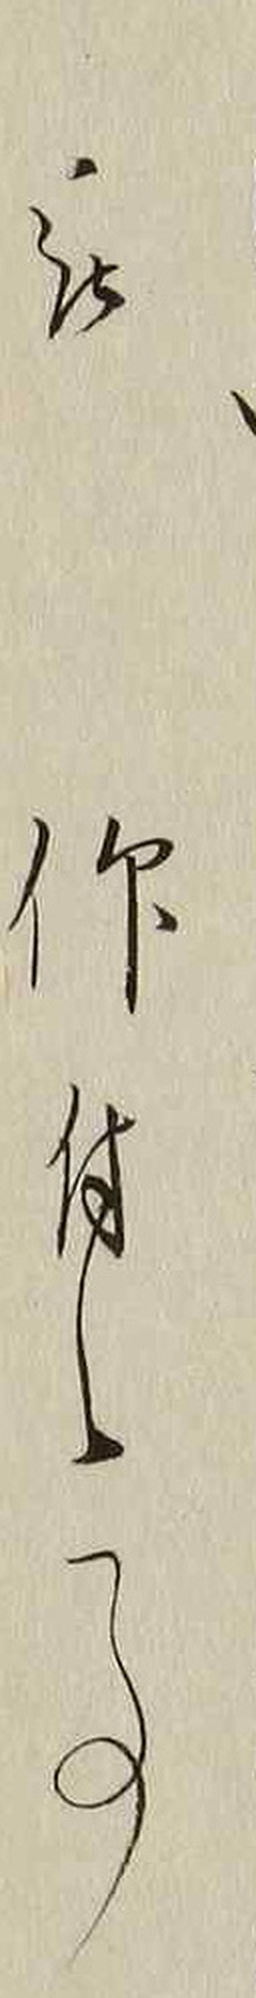被仰付候事
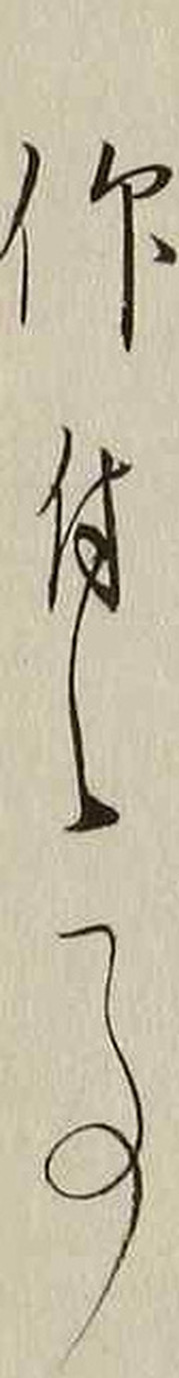仰付候事
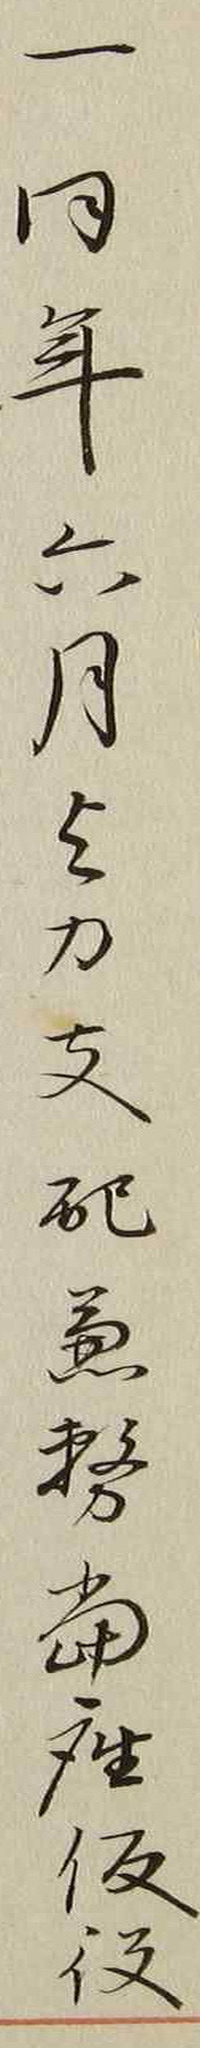一同年六月与力支配兼務当座仮役
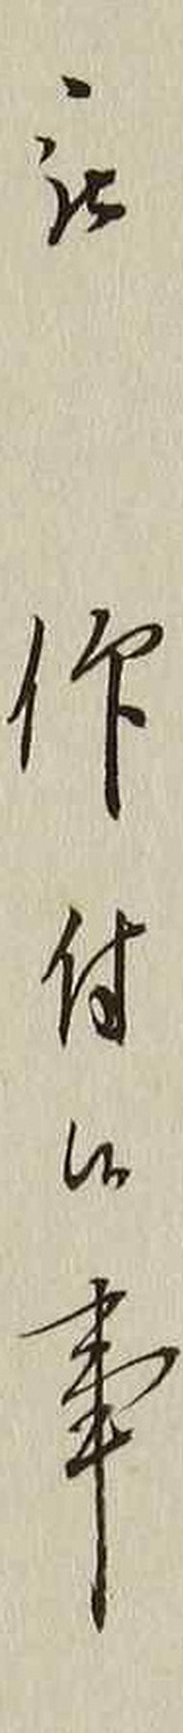被仰付候事
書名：諸士系譜　巻之22　い之部22
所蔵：会津若松市立会津図書館
